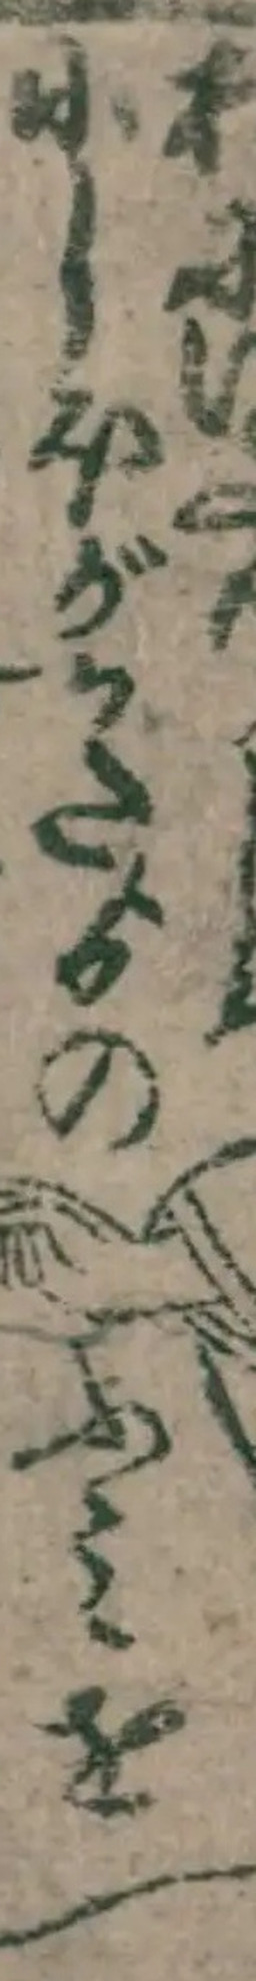小しほがかたよりのふみを
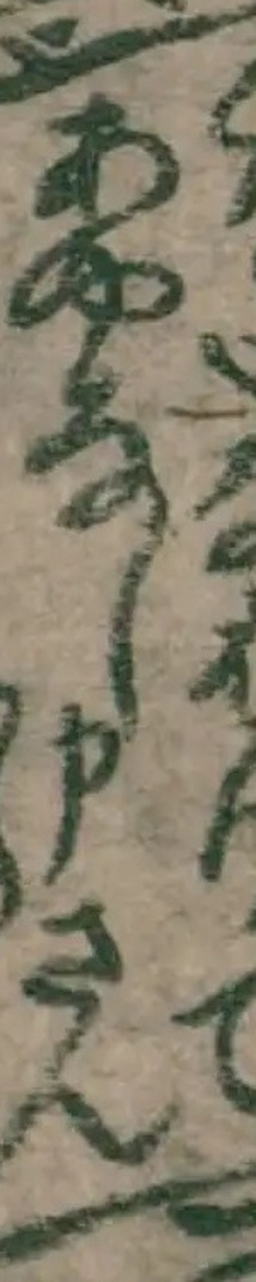あやなし申さん
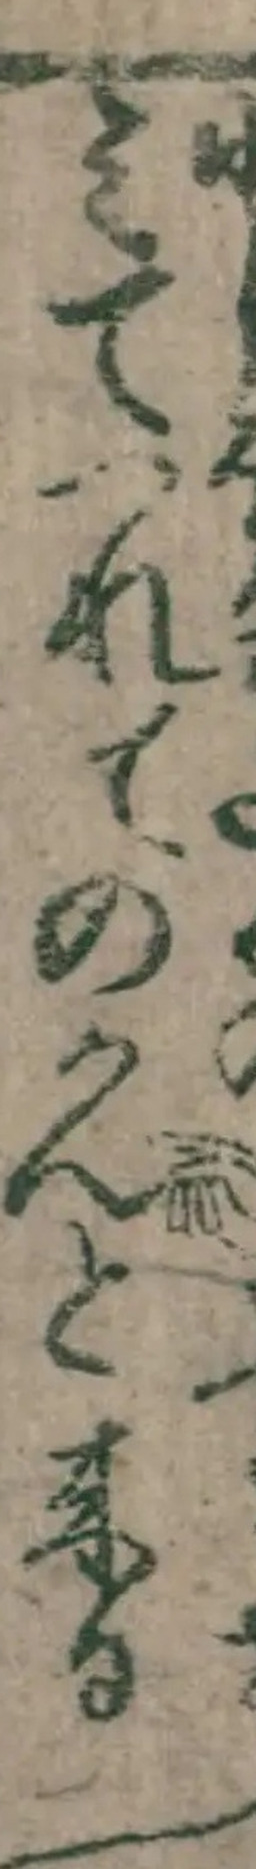みてつれてのかんと来る

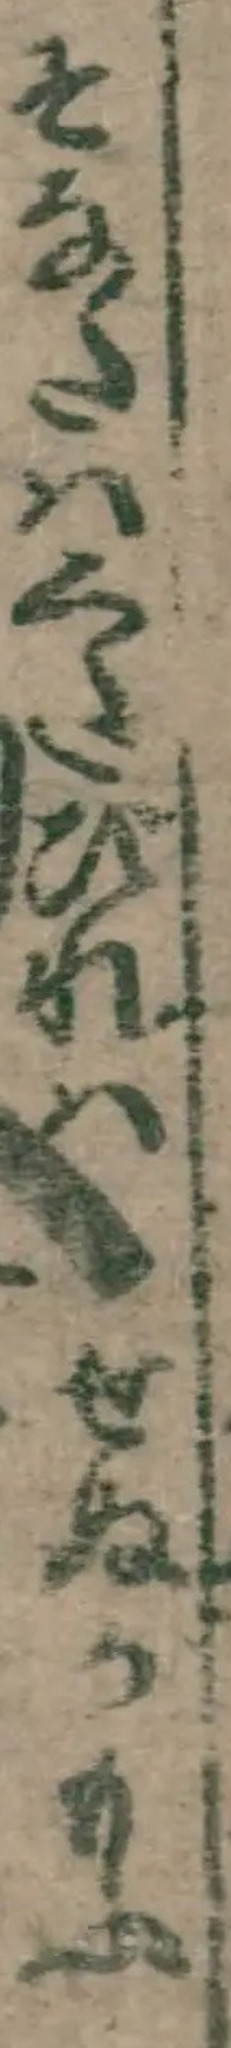そなたはくたびれはせぬかもふ
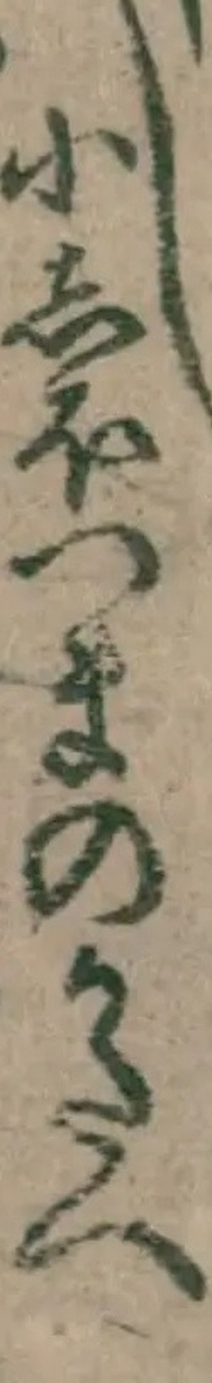小しほつまのかたへ
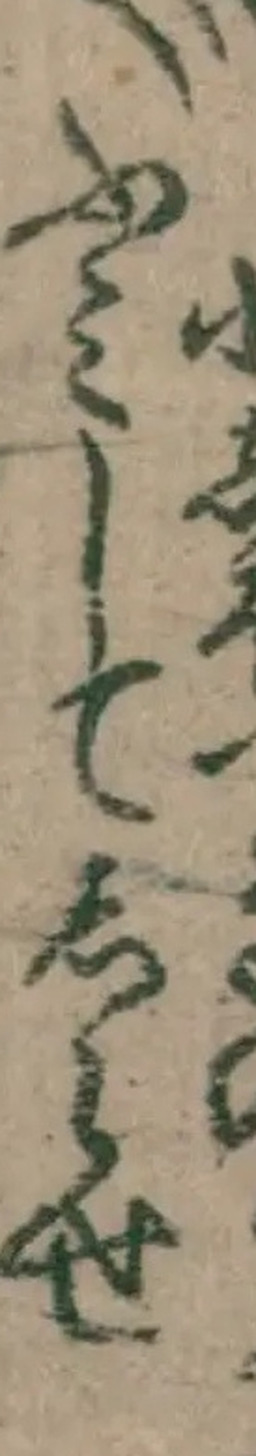ふみしてしらせ
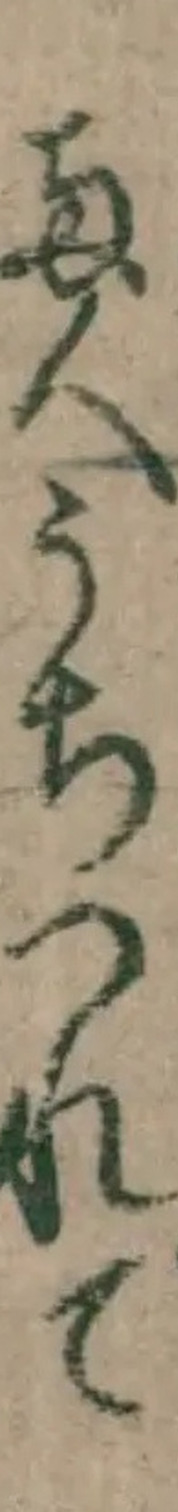両人うちつれて
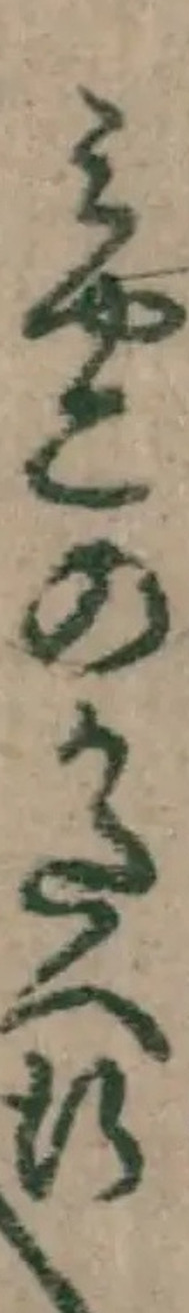みやこのかたへ行
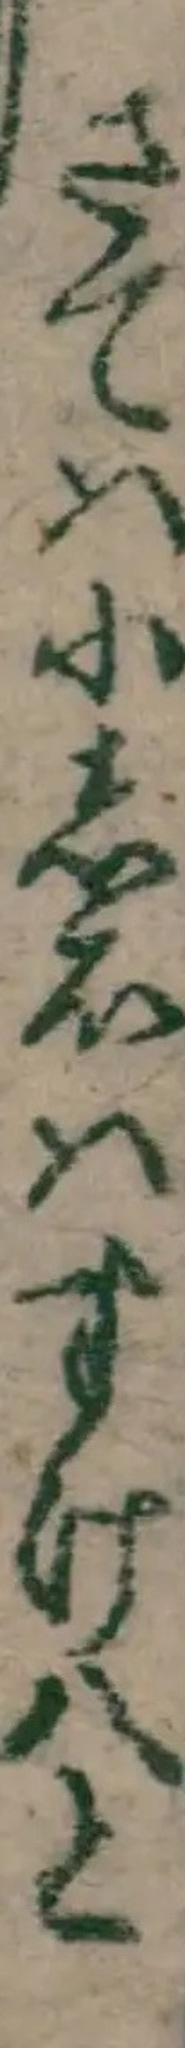さては小しほはすけ八と
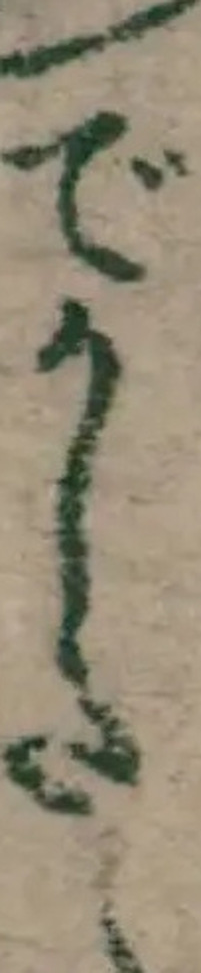でかした
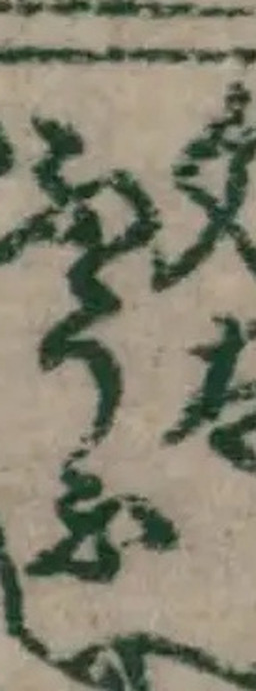ふうふ
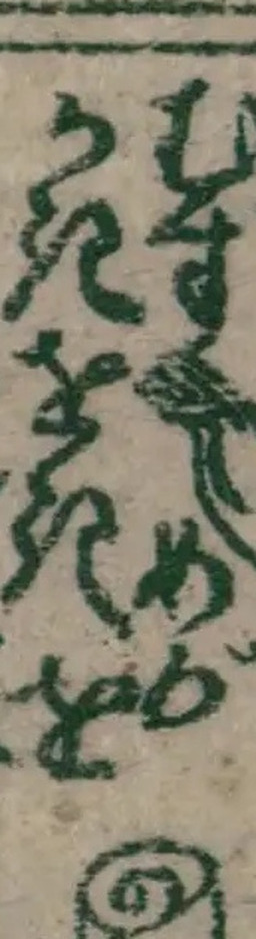かきをきを
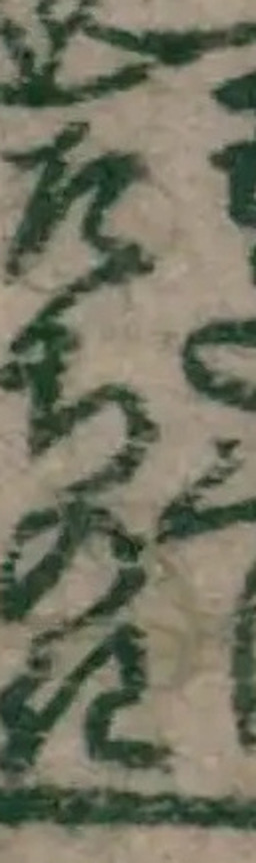たちのき
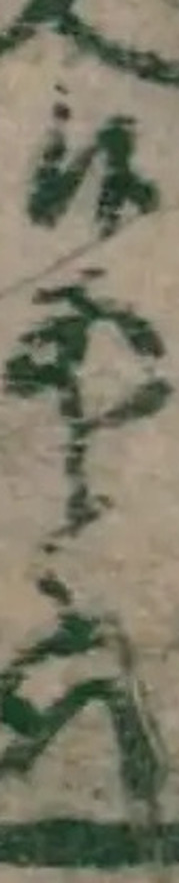候あとは
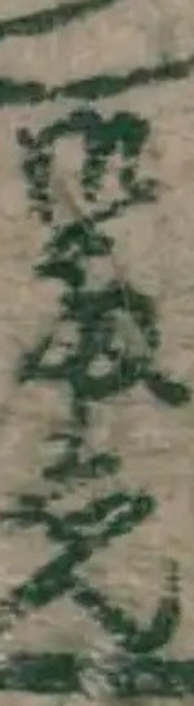御両しん
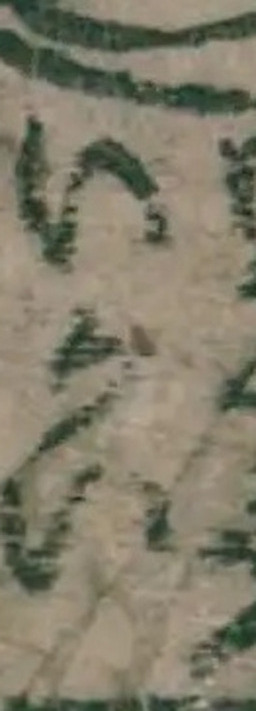いかい
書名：塩売文太物語 2巻
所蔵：国立国会図書館 National Diet Library, JAPAN
